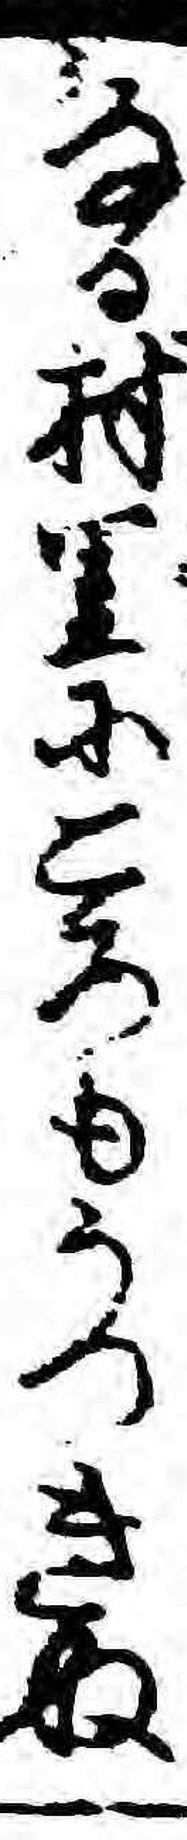なる村里にころもうつきぬ
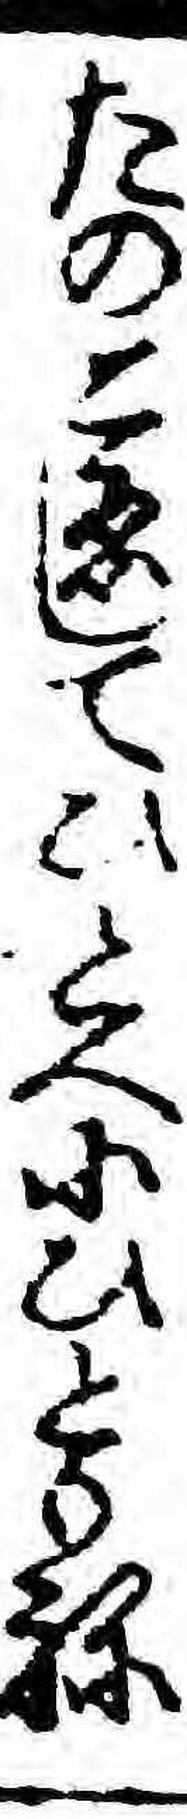たのこゑしてひとへにひとりね
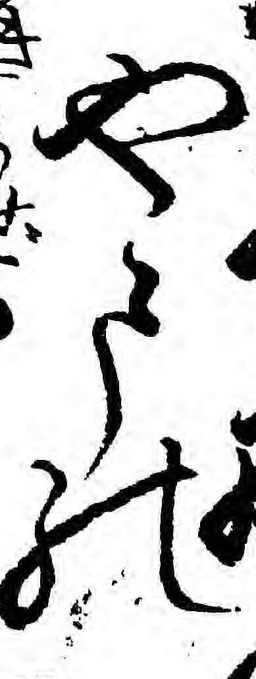やまの
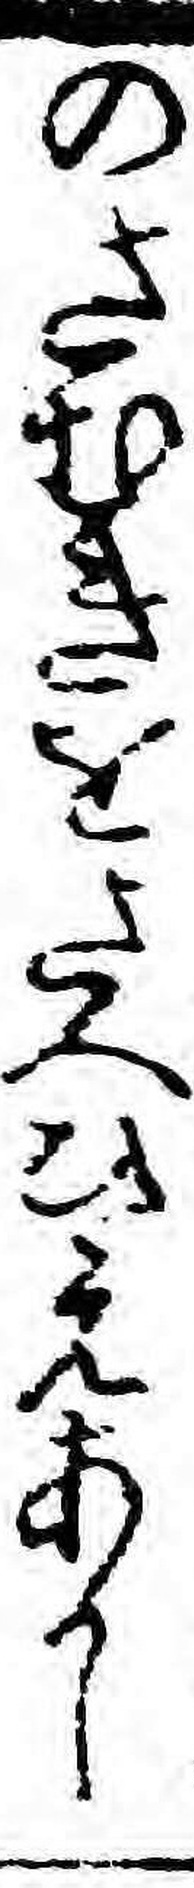のさむきをさへひえあかし
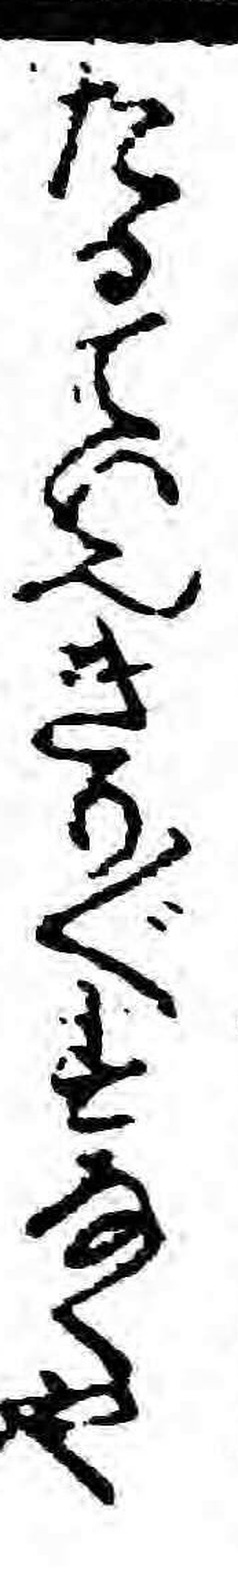たるてい也きり〴〵すなくや
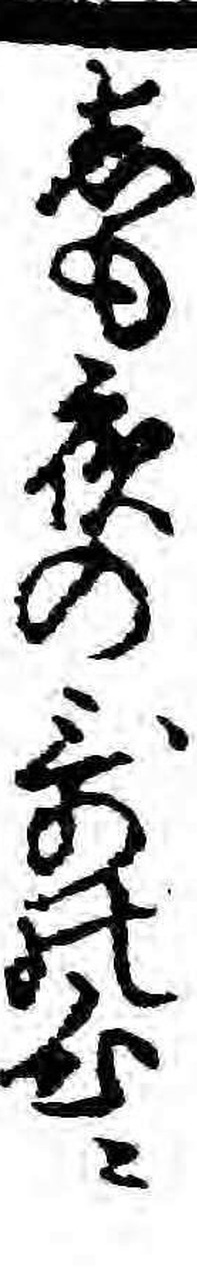しも夜の哥の心に
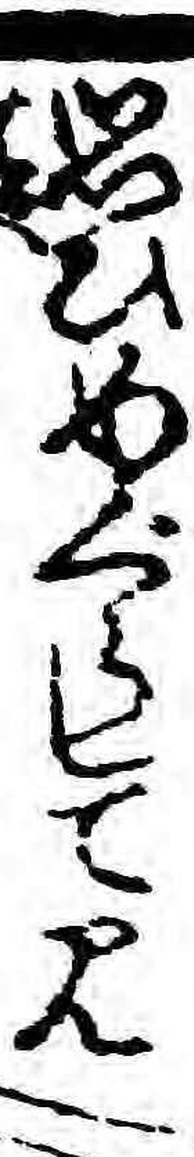思ひめぐらして見
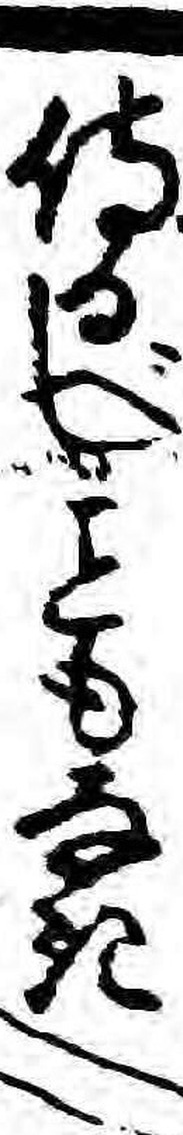侍るべしこともなき
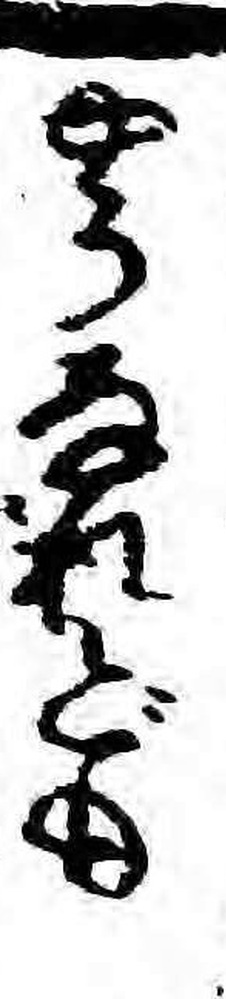やうなれども
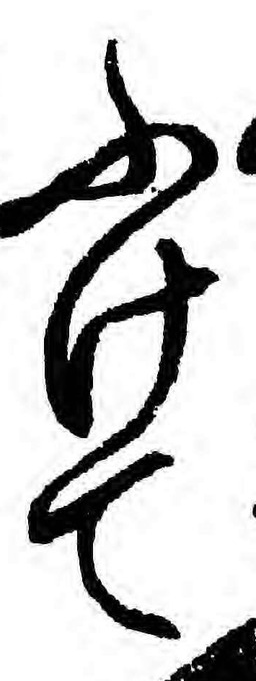ふけて
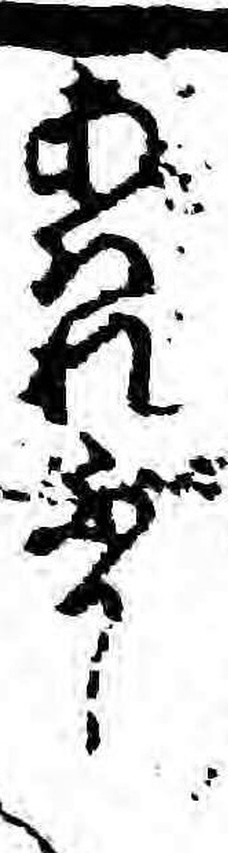あはれふかし
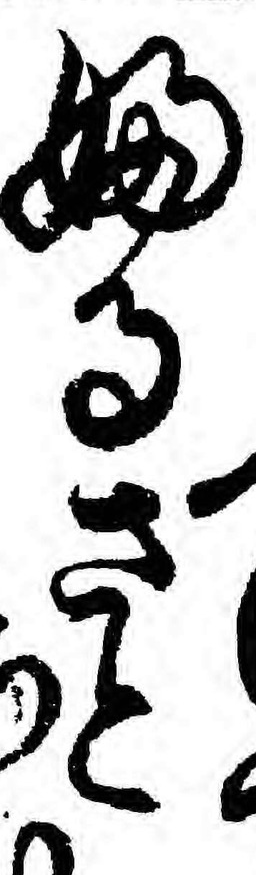ふるさと
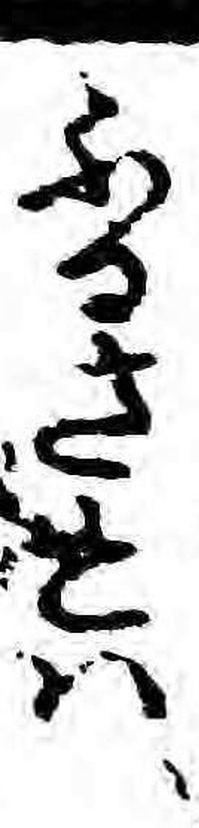ふるさとは
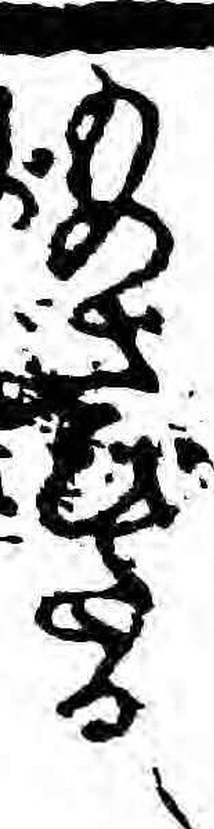ものさびたる
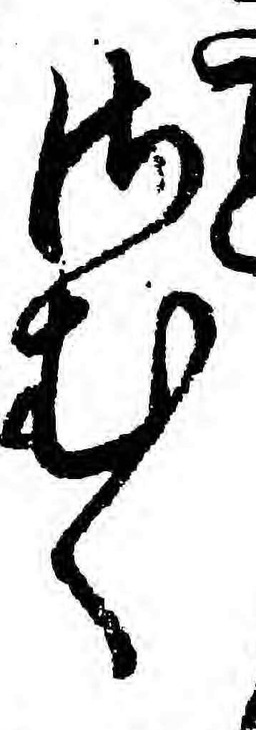さむく
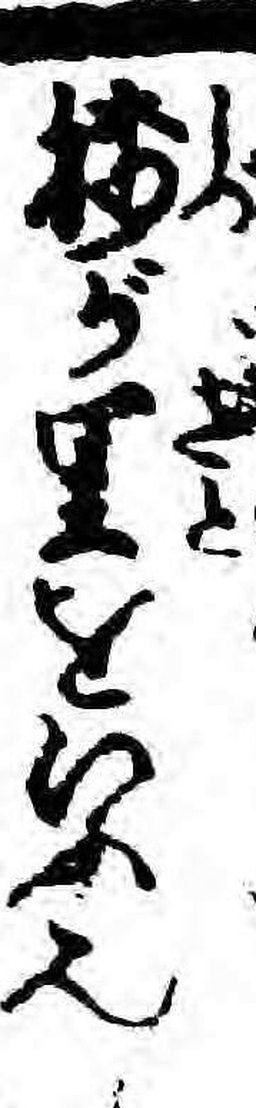賤が里をいふ也
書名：頭書和歌注譯／壽賀多百人一首小倉錦
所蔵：国文学研究資料館
